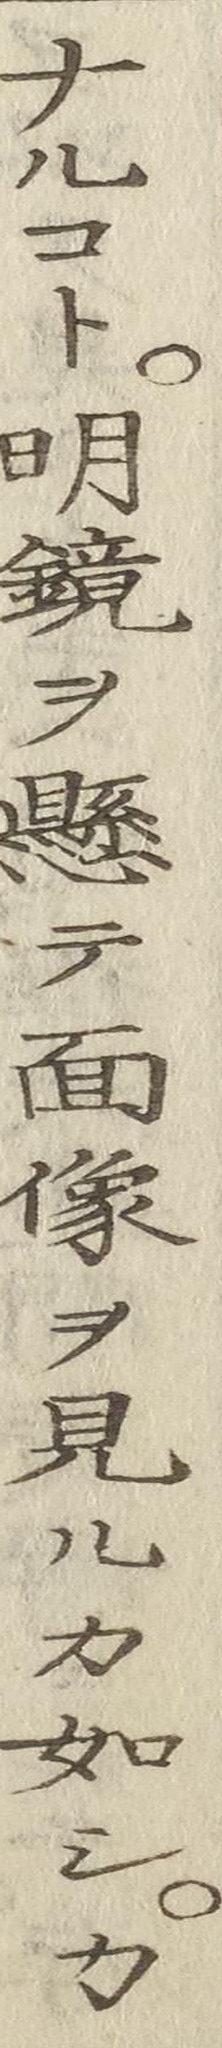ナルコト。明鏡ヲ懸テ面像ヲ見ルカ如シ。カ
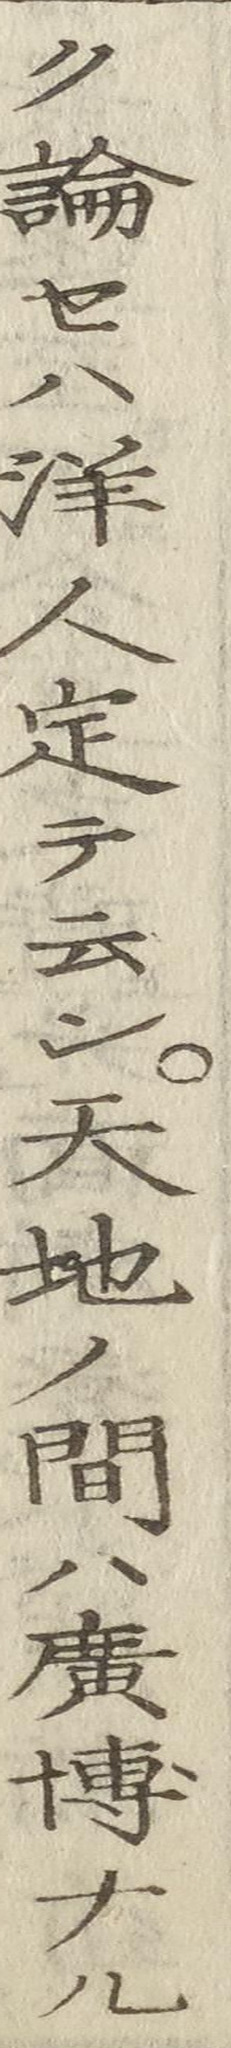ク論セハ洋人定テ云ン。天地ノ間ハ広博ナル
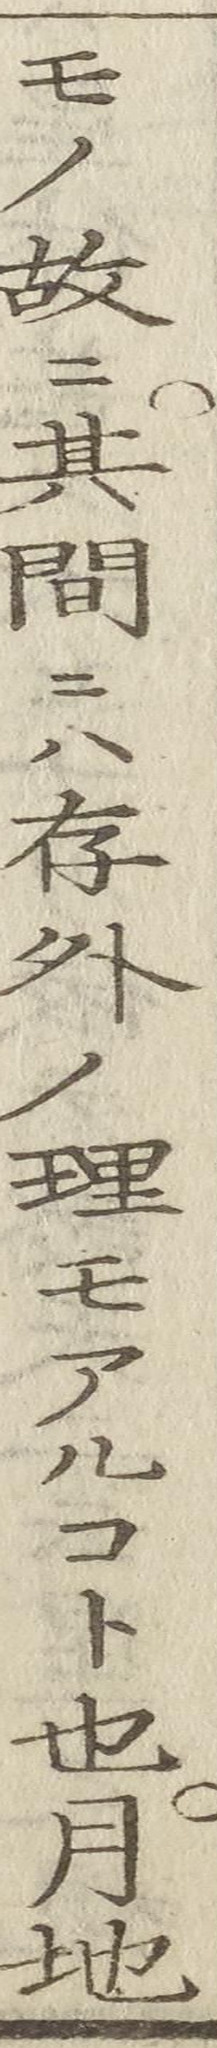モノ故ニ。其間ニハ存外ノ理モアルコト也。月地
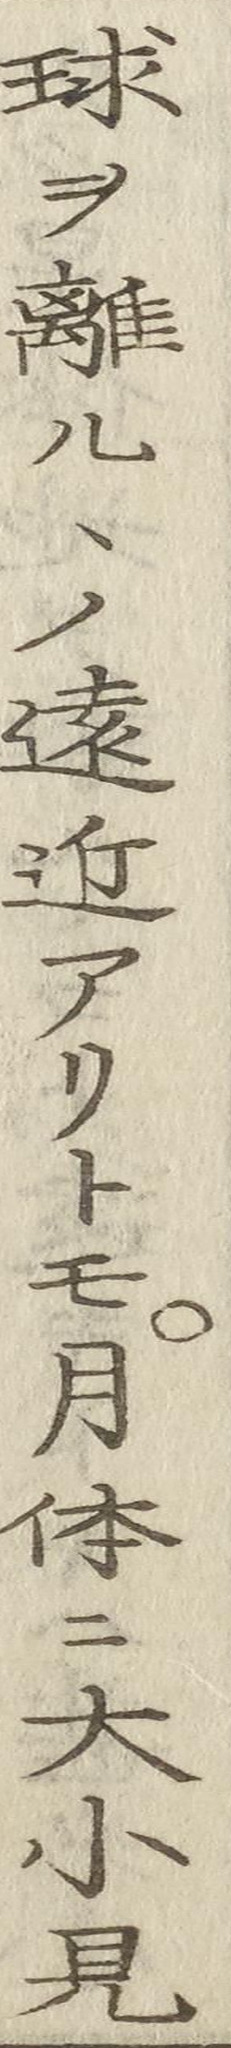球ヲ離ルヽノ遠近アリトモ。月体ニ大小見
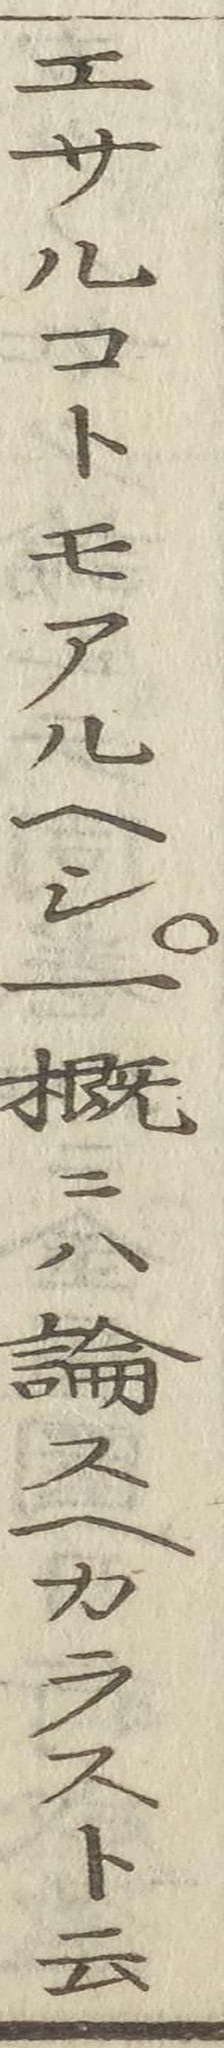エサルコトモアルヘシ。一概ニハ論スヘカラスト云
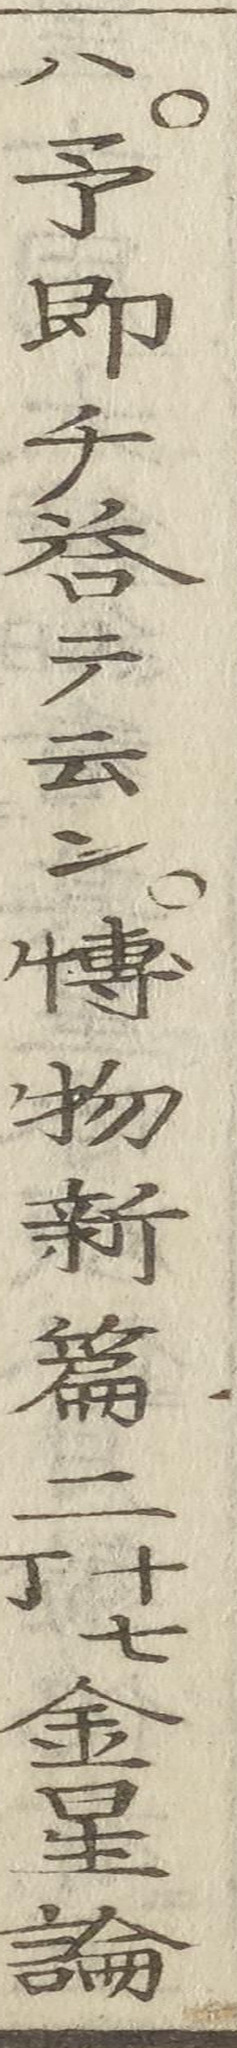ハ。予即チ答テ云ン。博物新篇ニ十七丁金星論
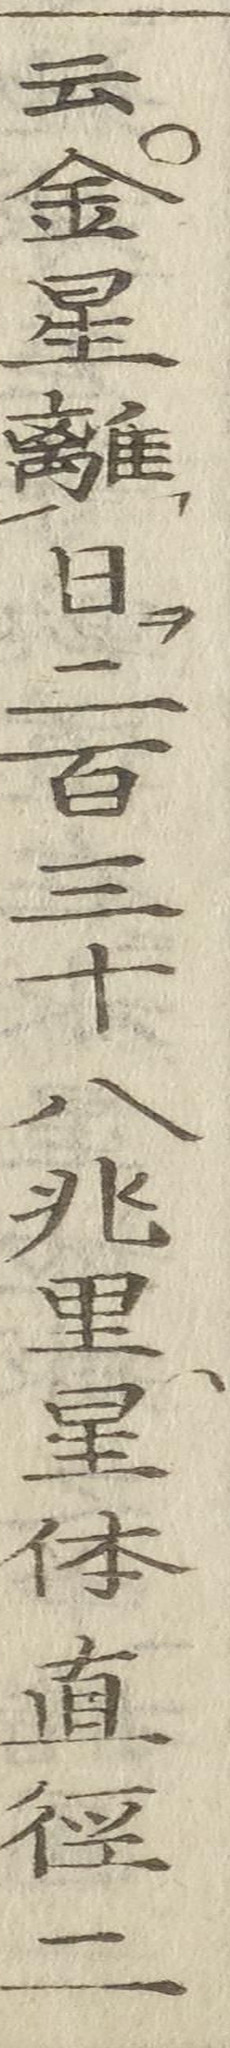云。金星離日二百三十八兆里星体直径二

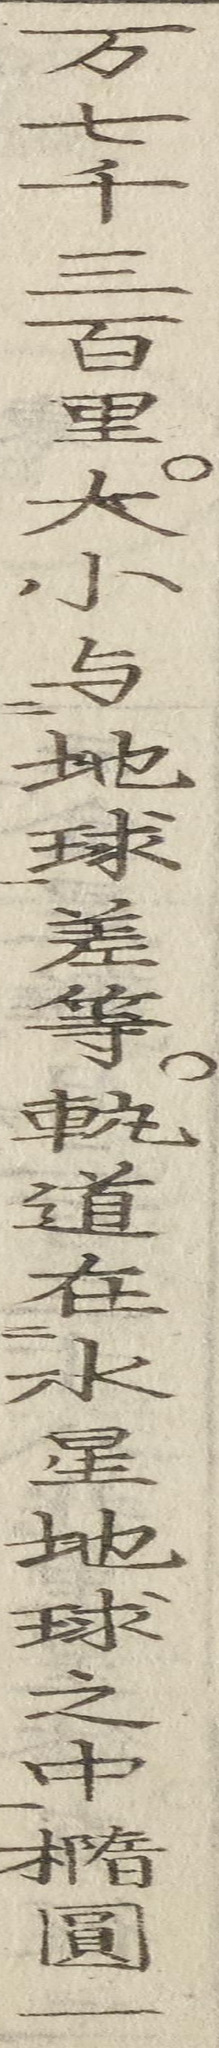万七千三百里。大小与地球差等。軌道在水星地球之中憜円一
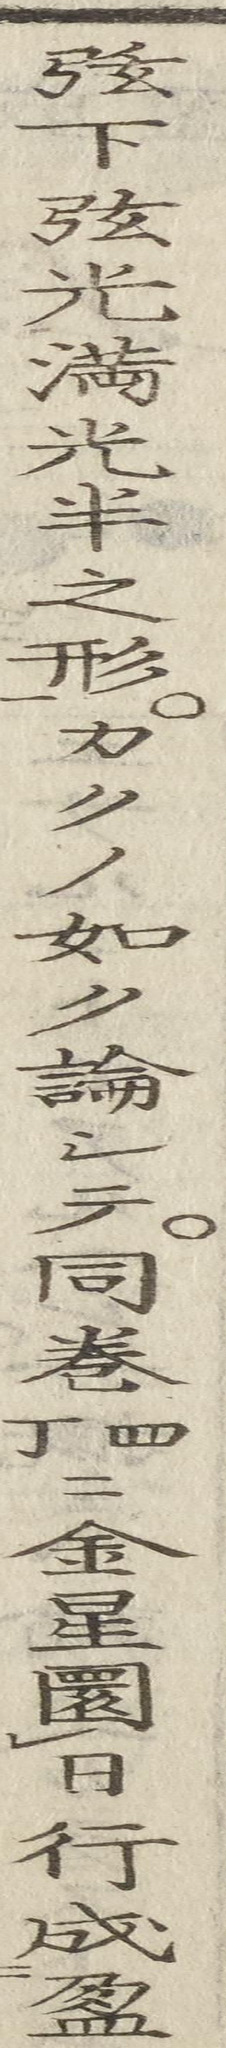弦下弦光満光半之形。カクノ如ク論シテ。同巻四丁ニ金星圜日行成盈
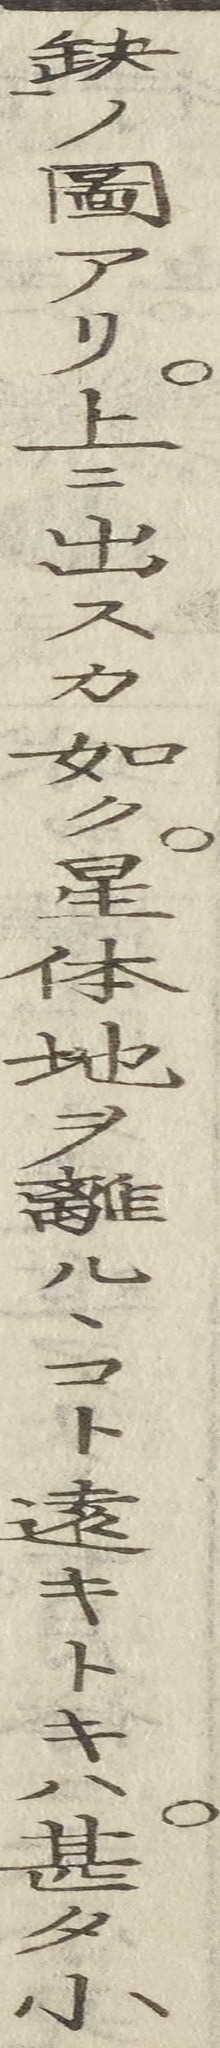缺ノ図アリ。上ニ出スカ如ク。星体地ヲ離ルヽコト遠キトキハ。甚タ小
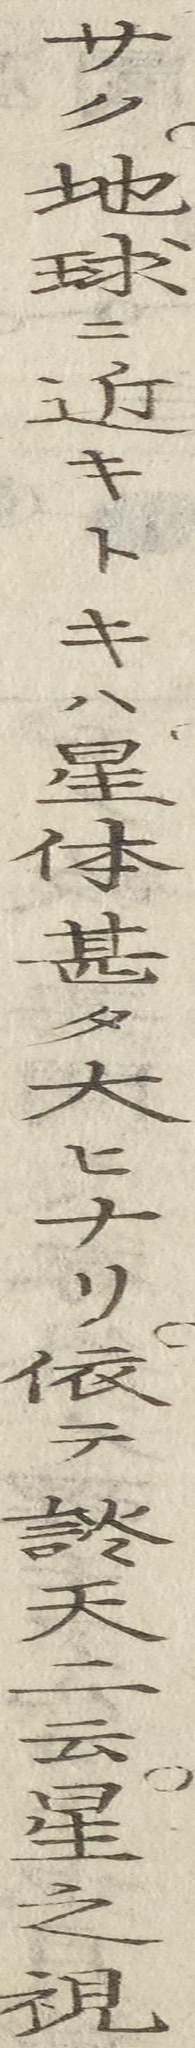サク。地球ニ近キトキハ星体甚タ大ヒナリ。依テ談天ニ云。星之視
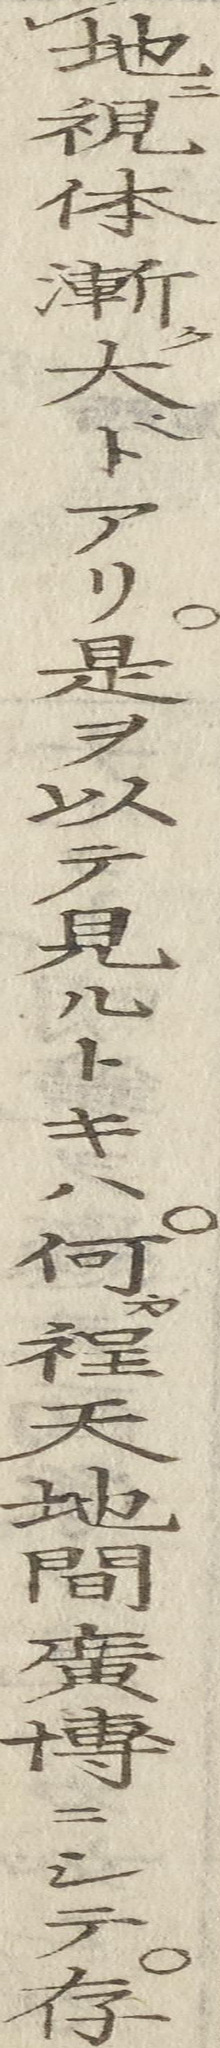地二視体漸大トアリ。是ヲ以テ見ルトキハ。何程天地間広博ニシテ。存
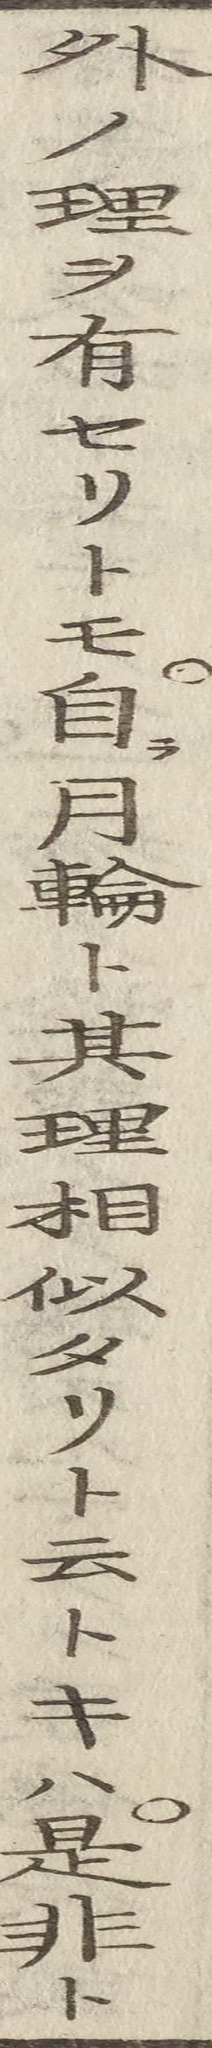外ノ理ヲ有セリトモ。自月輪ト其理相似タリト云トキハ。是非ト
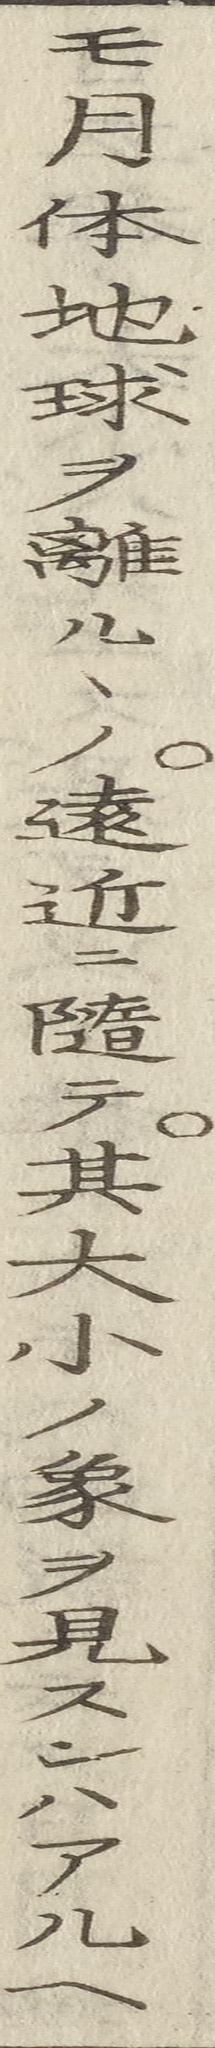モ月体地球ヲ離ルヽノ。遠近ニ随テ。其大小ノ象ヲ見スンハアルヘ
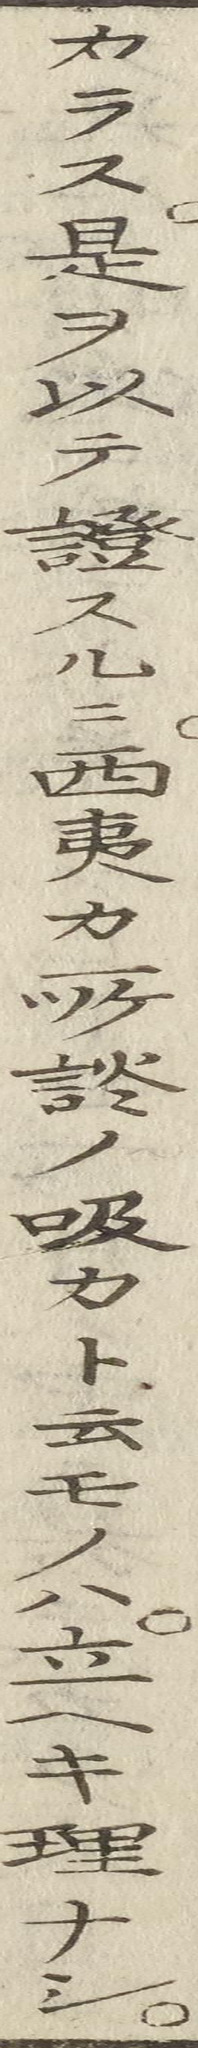カラス。是ヲ以テ証スルニ。西夷カ所談ノ吸カト云モノハ。立ヘキ理ナシ。
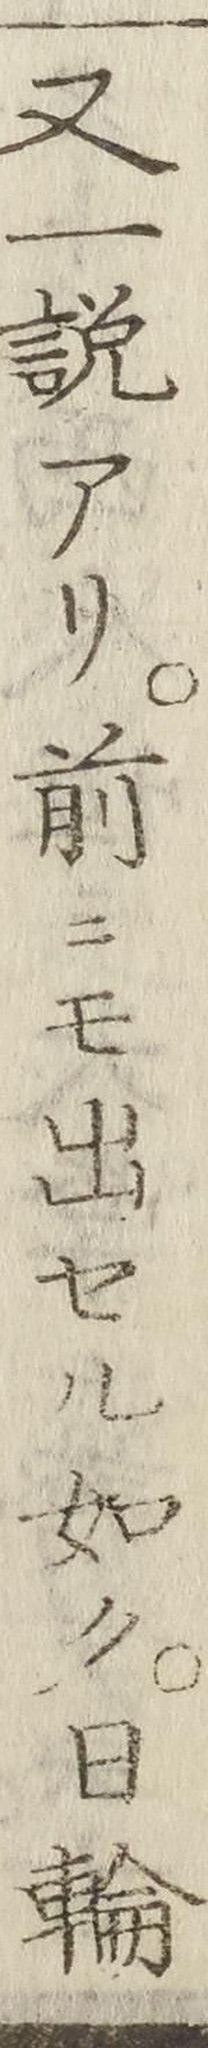又一説アリ。前ニモ出セル如ク。日輪
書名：護法新論　中
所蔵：東京大学地震研究所図書室 Earthquake Research Institute Library, The University of Tokyo, JAPAN
